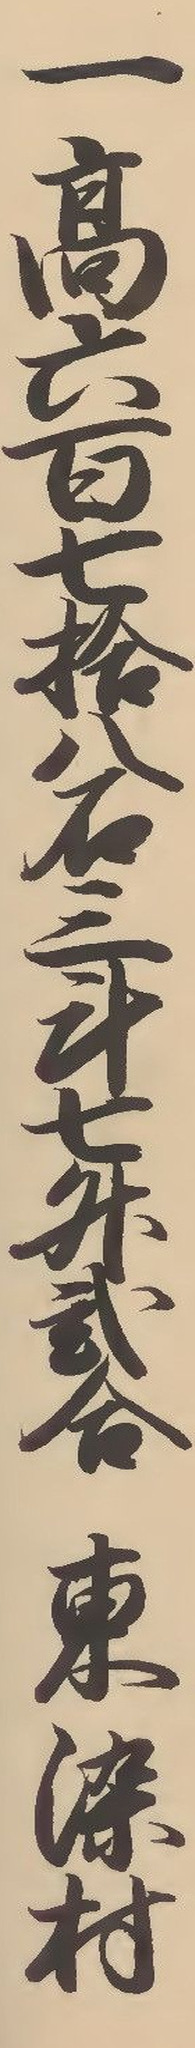一高六百七拾八石三斗七升弐合東染村
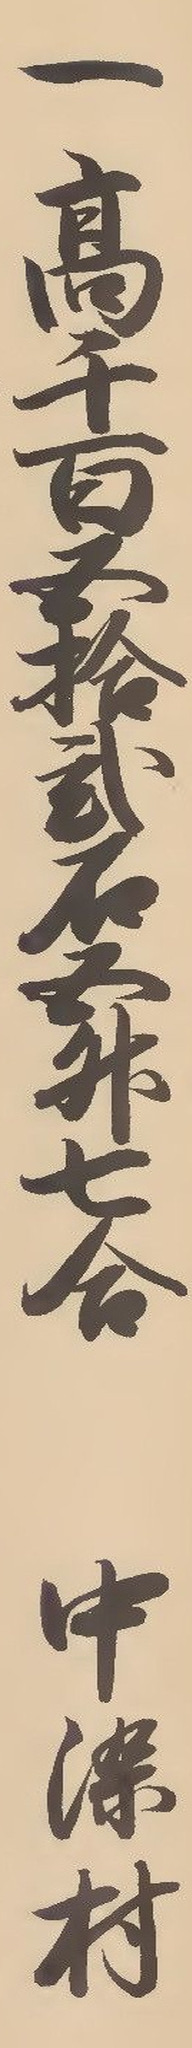一高千百五拾弐石五升七合中染村
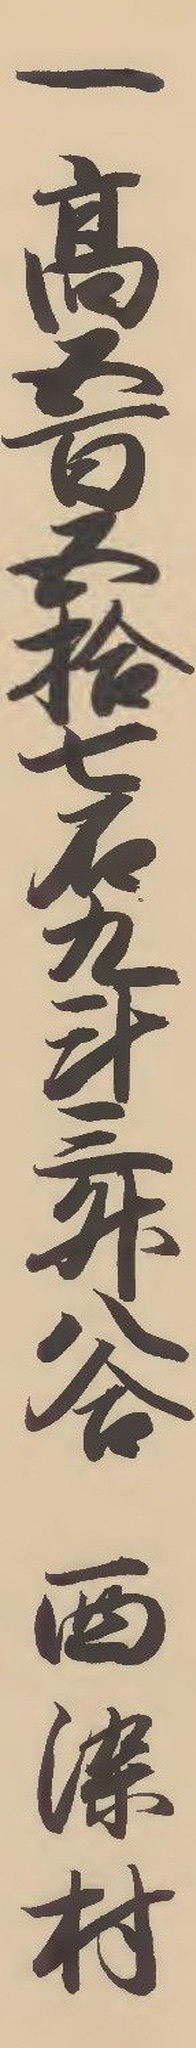一高五百五拾七石九斗三升八合西染村
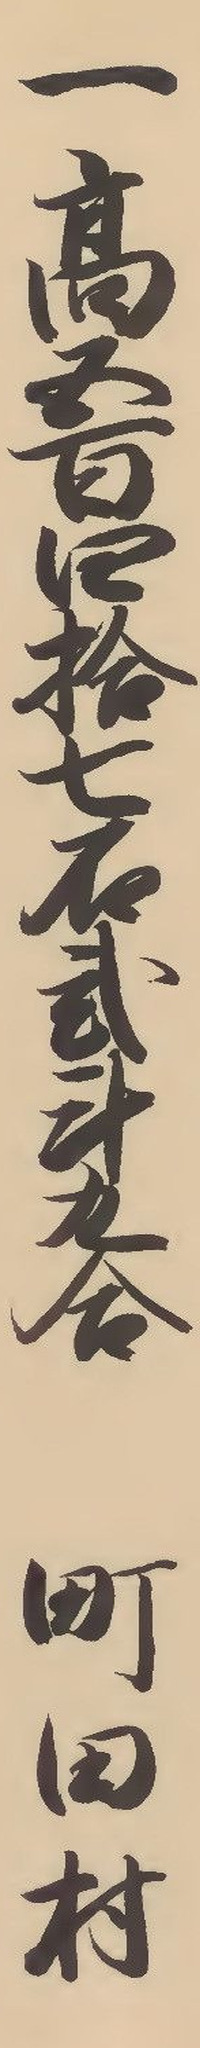一高五百四拾七石弐斗九合町田村
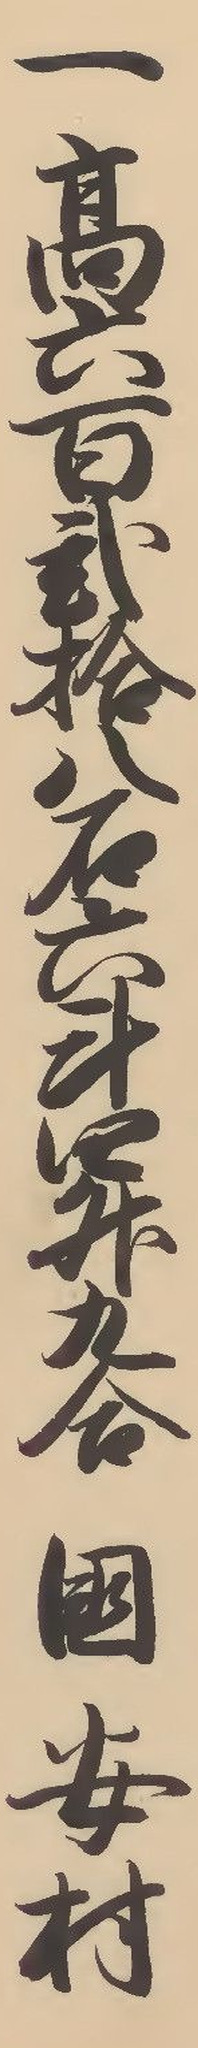一高六百弐拾八石六斗四升九合国安村

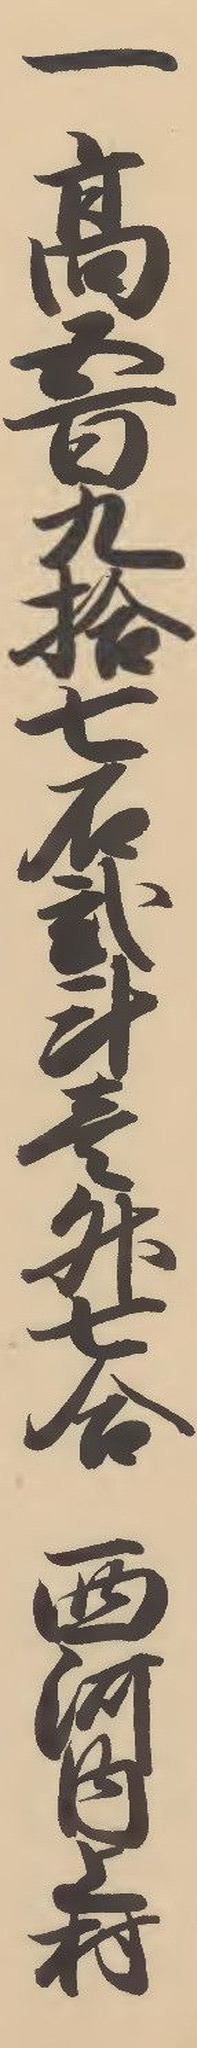一高五百九拾七石弐斗壱升七合西河内上村
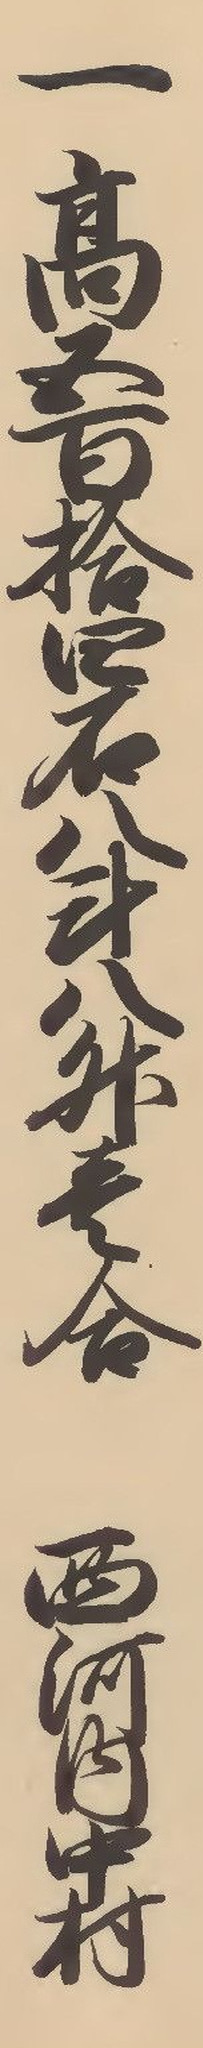一高五百拾四石八斗八升壱合西河内中村
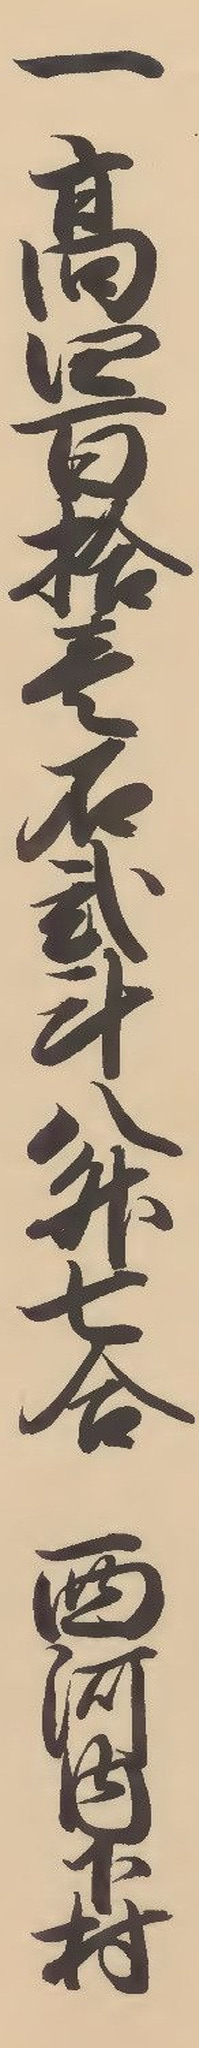一高四百拾壱石弐斗八升七合西河内下村
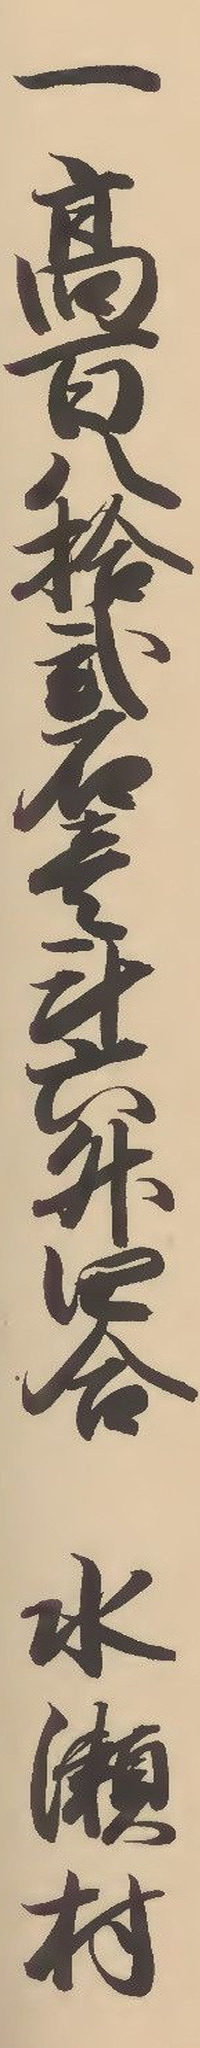一高百八拾弐石壱斗六升四合水瀬村
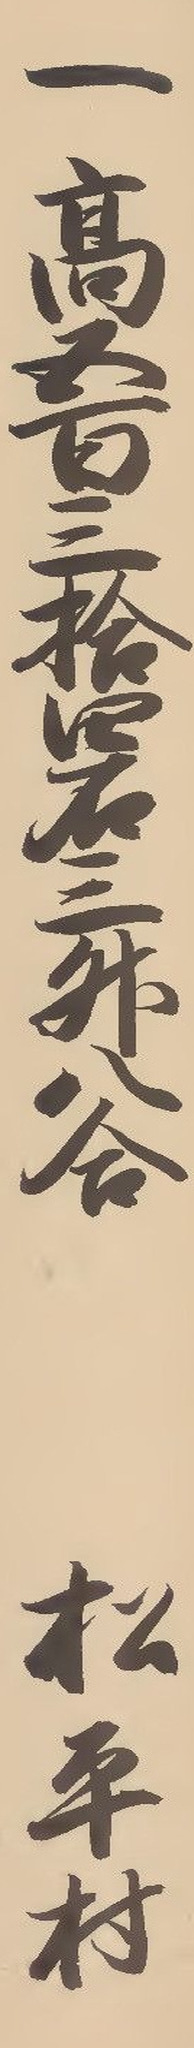一高五百三拾四石三升八合松平村
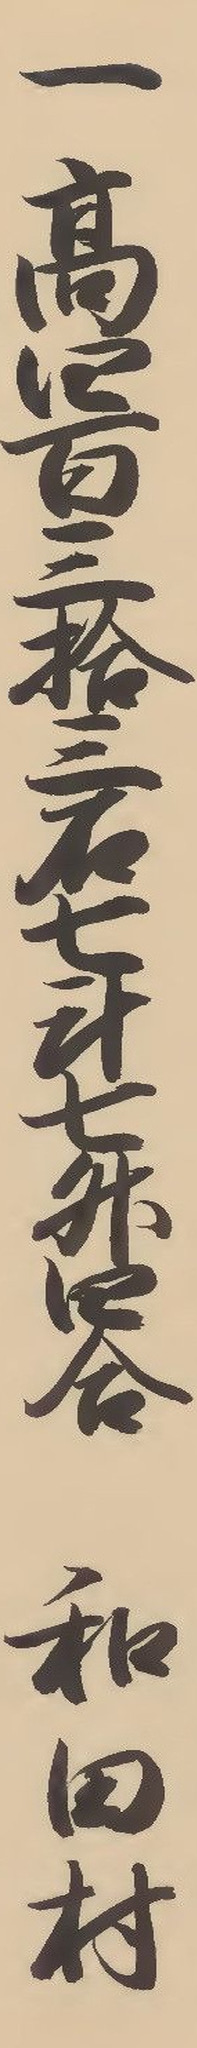一高四百三拾三石七斗七升四合和田村
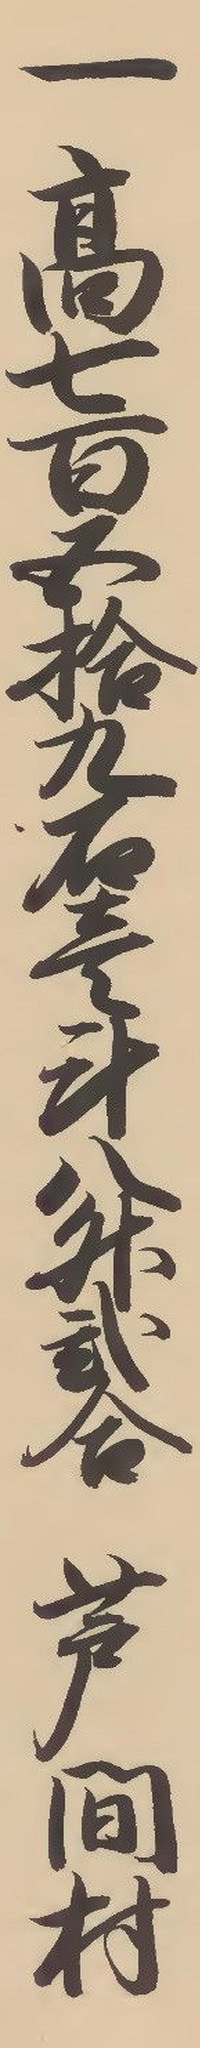一高七百五拾九石壱斗八升弐合芦間村
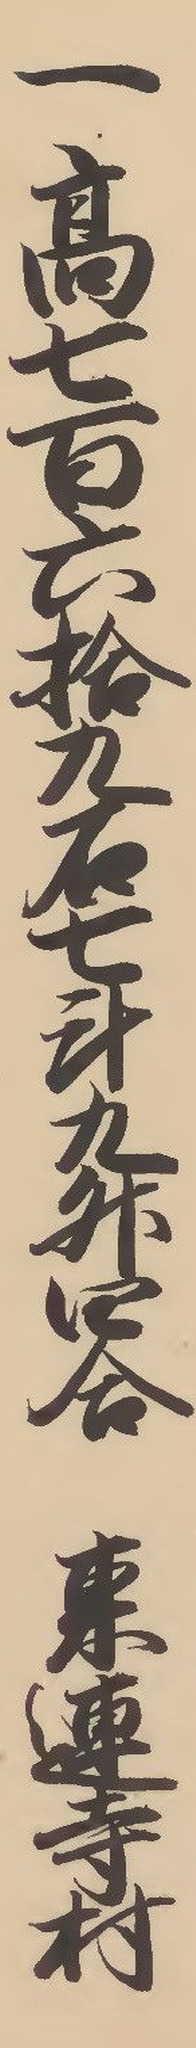一高七百六拾九石七斗九升四合東連寺村

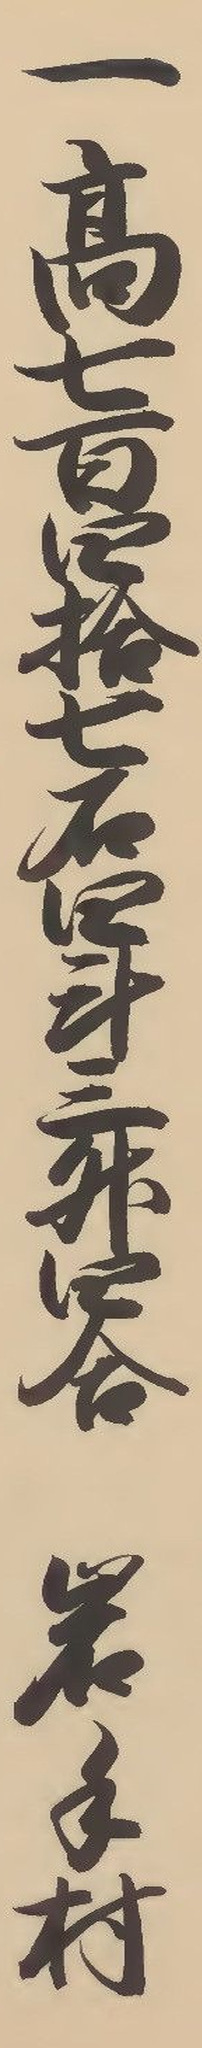一高七百四拾七石四斗三升四合岩手村
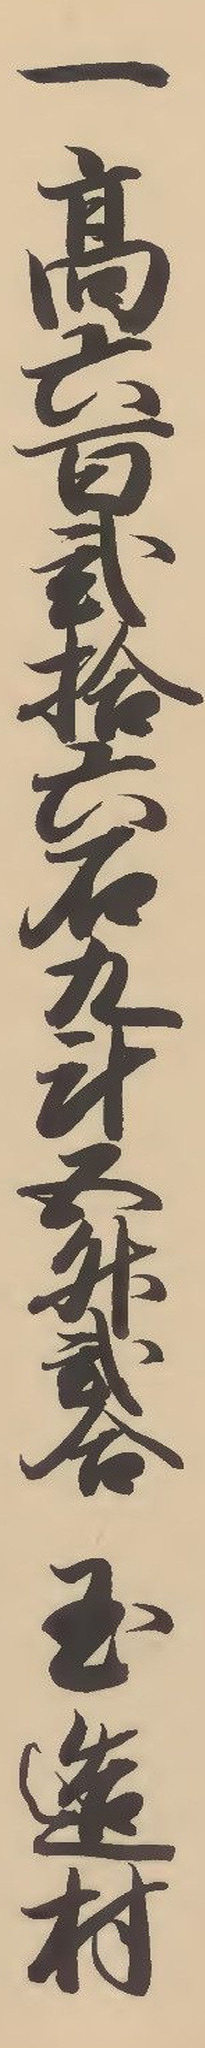一高六百弐拾六石九斗五升弐合玉造村
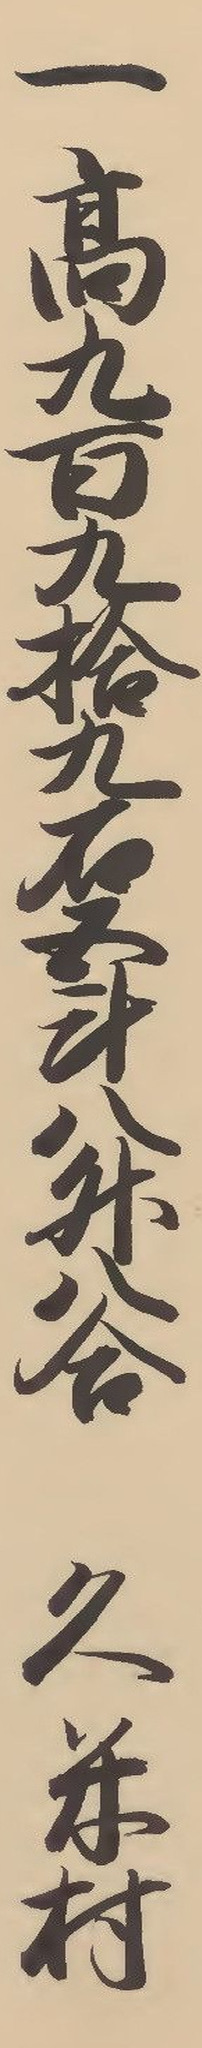一高九百九拾九石五斗八升八合久米村
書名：常陸国郷帳
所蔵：国立公文書館 National Archives of Japan
